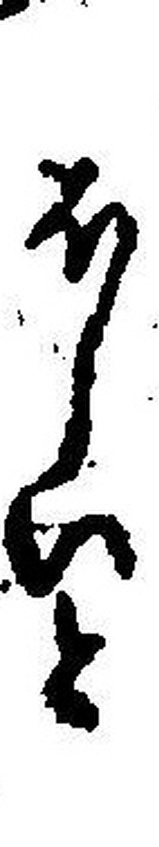ほしいと
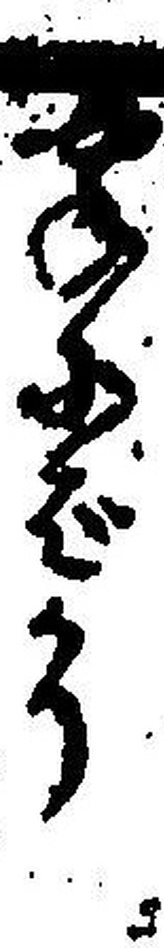やねにばかり
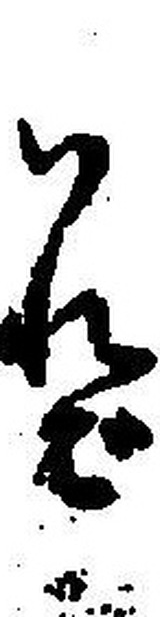いれば
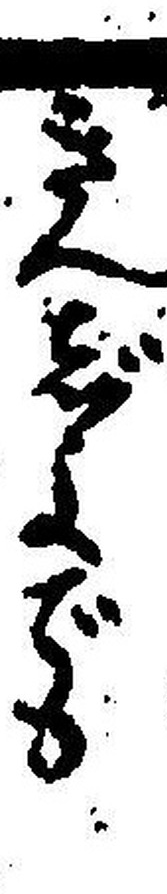きんじよでも
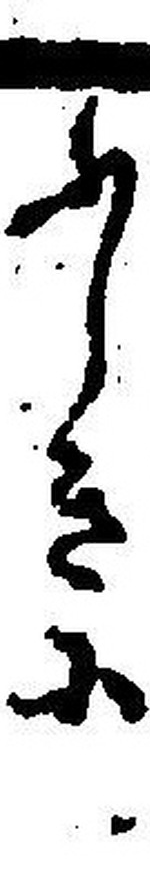ふしきに
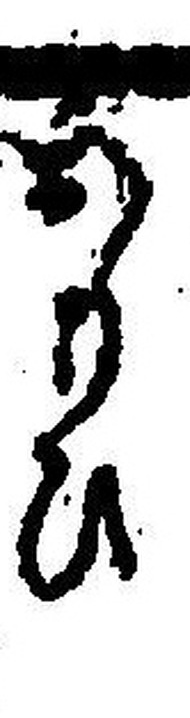おもひ
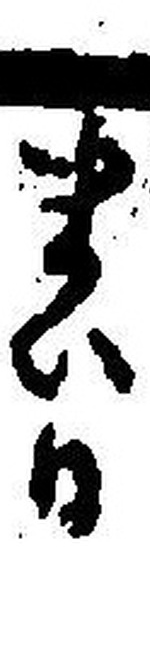まい日
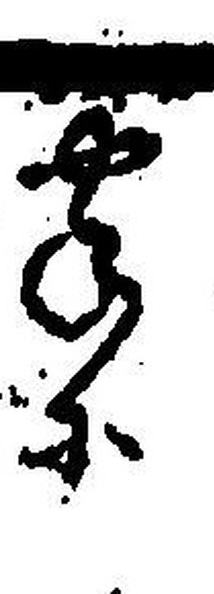やねに
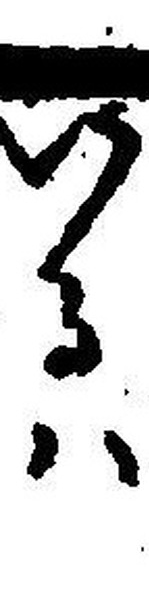いるは
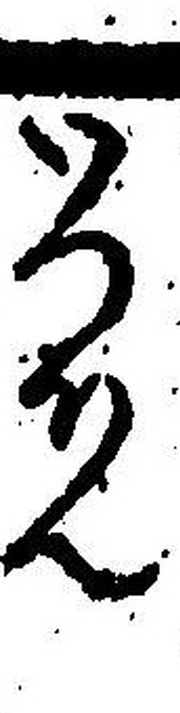いつほん
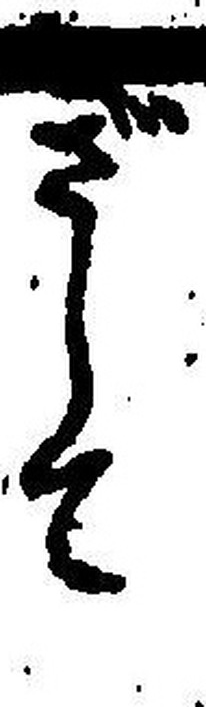ざして
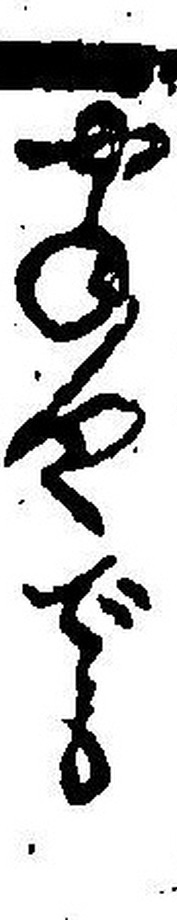やねやでも
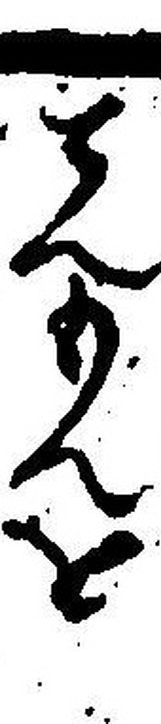てんもんを
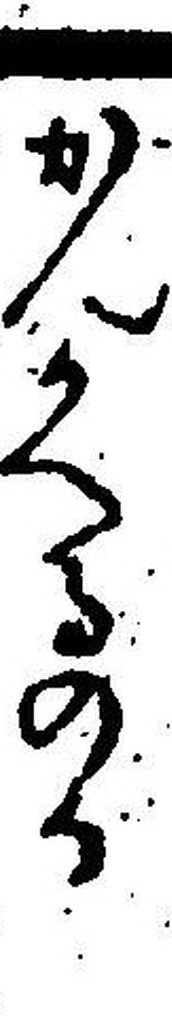かんかへるのか
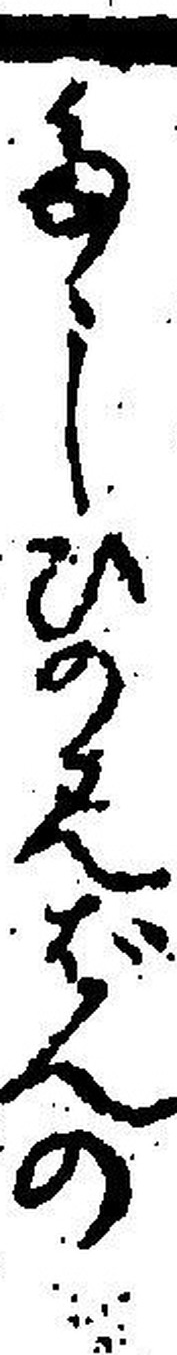たゝしひの見ばんの
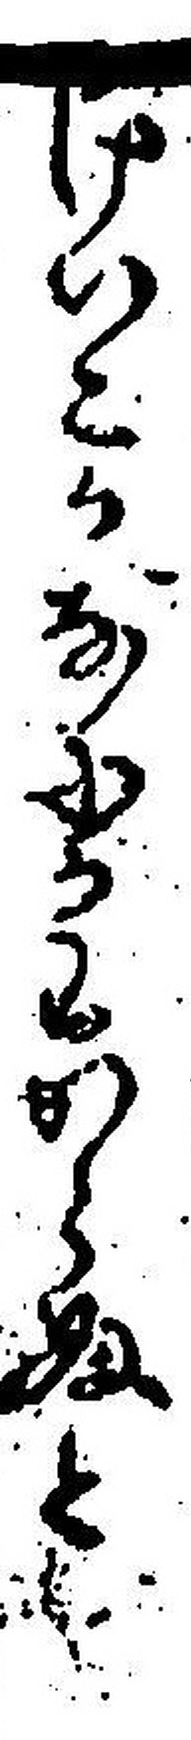けいこかなにかわからぬと
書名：牡丹餅棚有 / 市場通笑作
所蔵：東京大学総合図書館 General Library in the University of Tokyo, JAPAN
